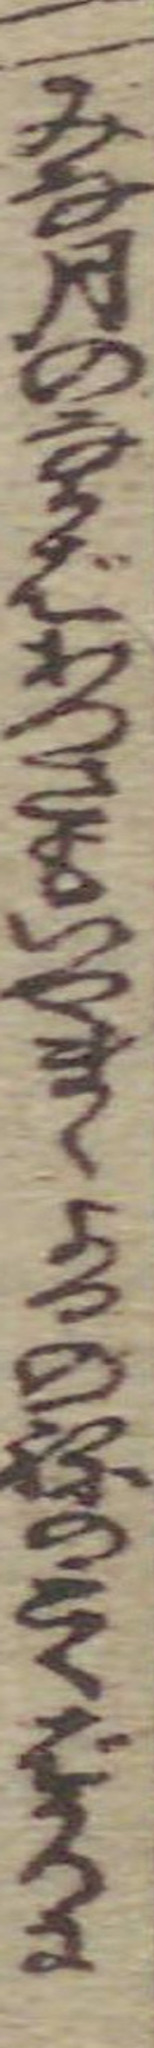みな月のなかばあつさもいやましよるのねのこくばかりに
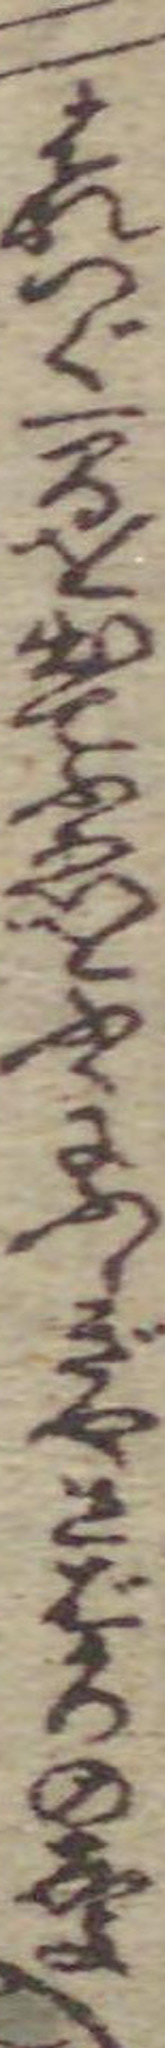はれつぐ一間を出てふゑをふくにふしぎやさばかりのしよ
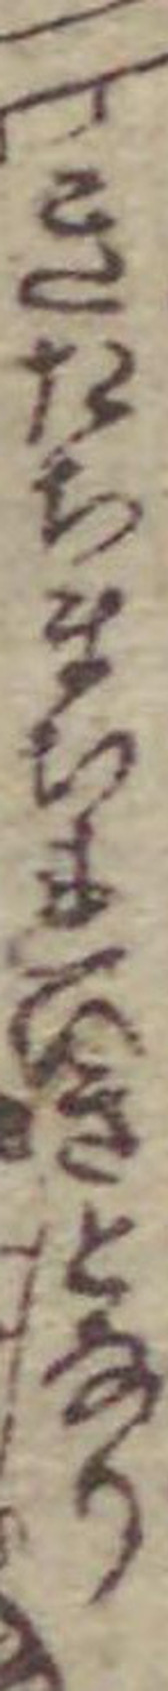きたちまちれいきとなり
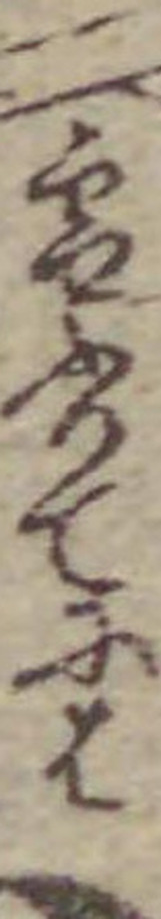雹ふりてには
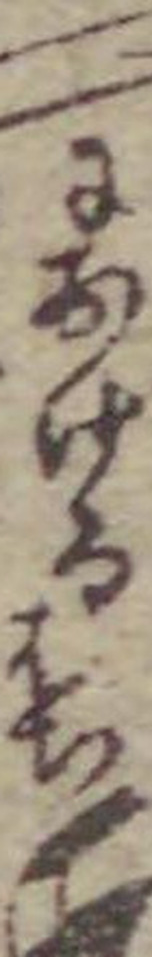におけるはち
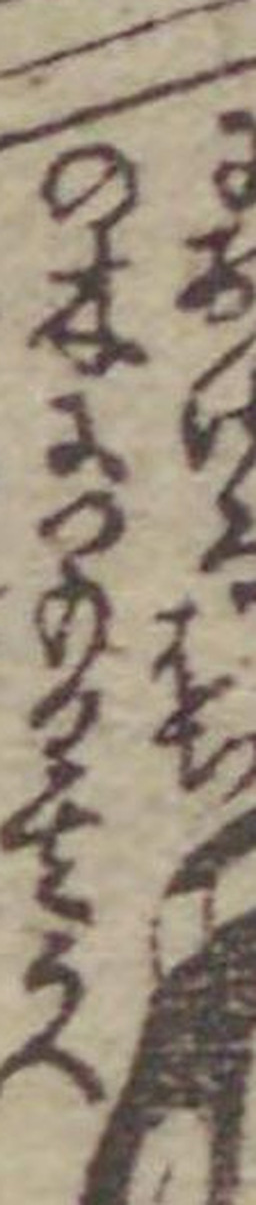の木につもる其うへ
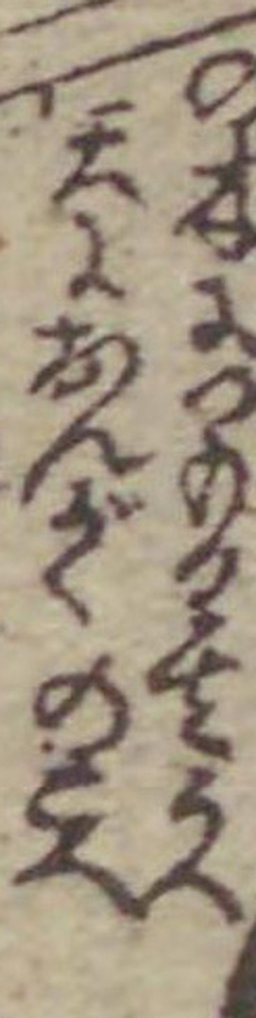天におんがくのこへ
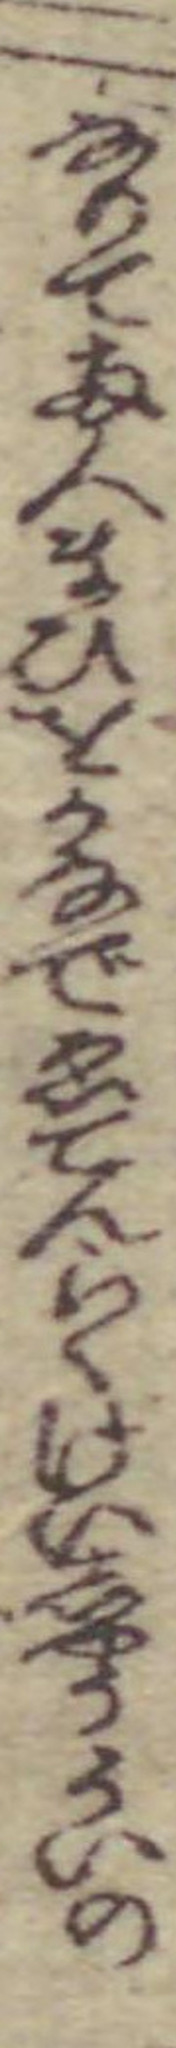なりて両人まひをかなでゑてんらくけいしやうういの
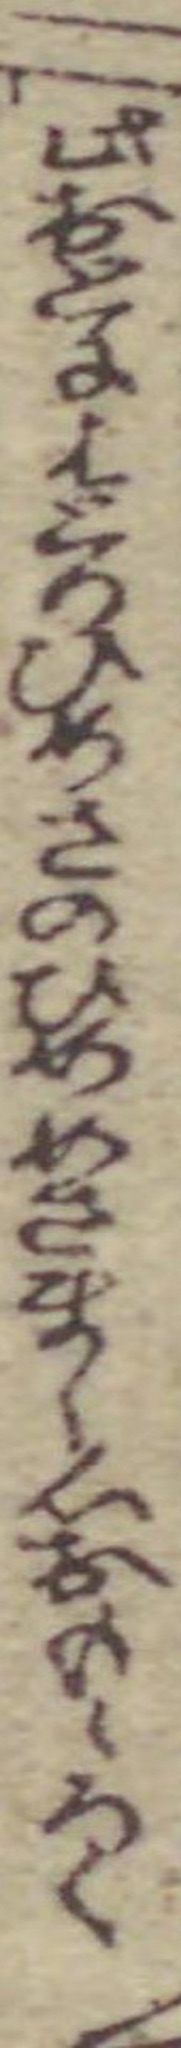此おとにはとりひめさのひめめさまし心おもしろく
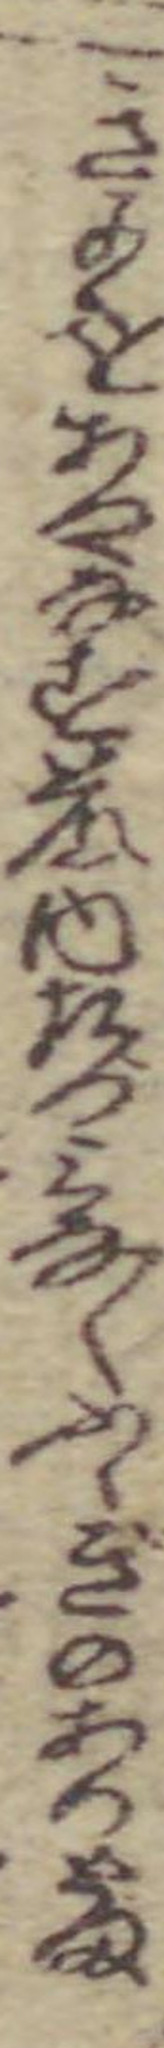きよくをあやなす藤内左衛門みな〳〵ふしぎのありさま
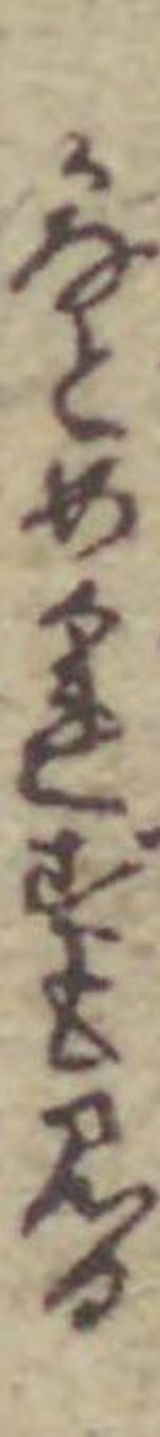かなとめけれずも見る
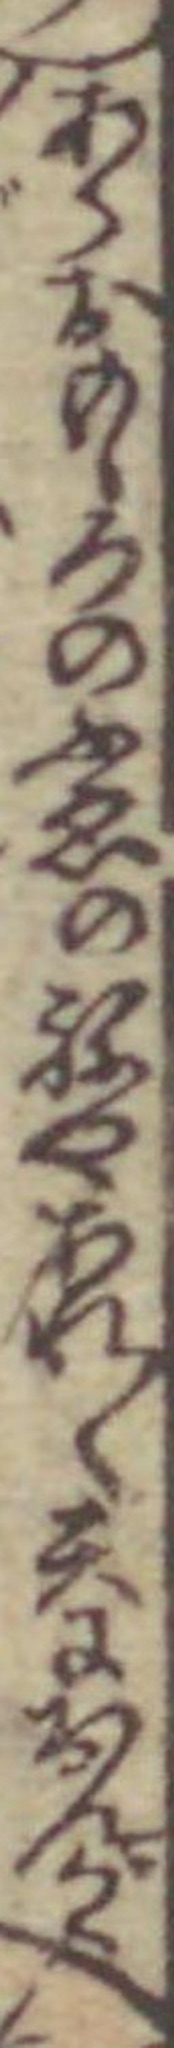あらおもしろのふゑのねやあれ〳〵天におんがく
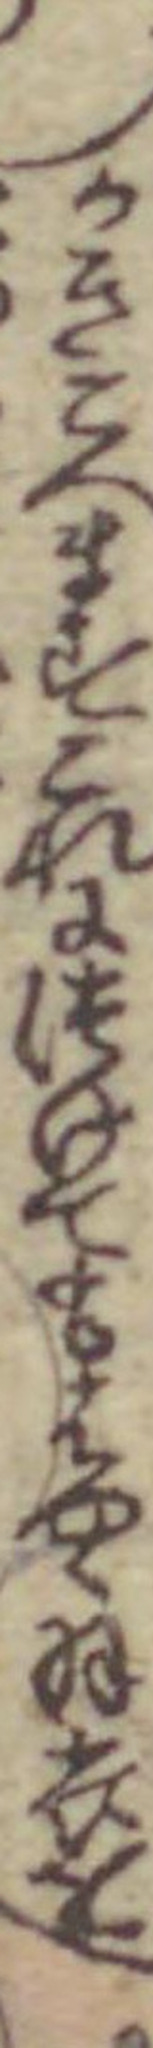がきこへますこれにつけてもはやく羽衣を
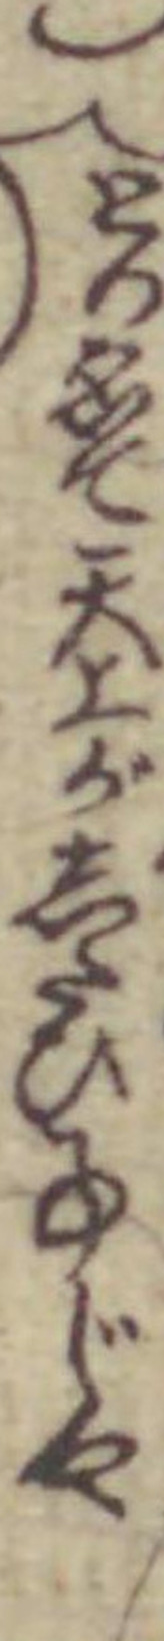とりゑて天上がしたひ事じや
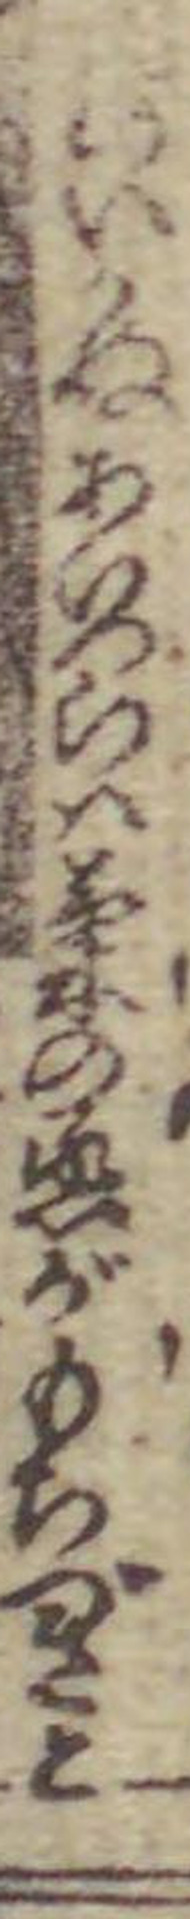いかぬあいつらは菊の丞がもちづきと
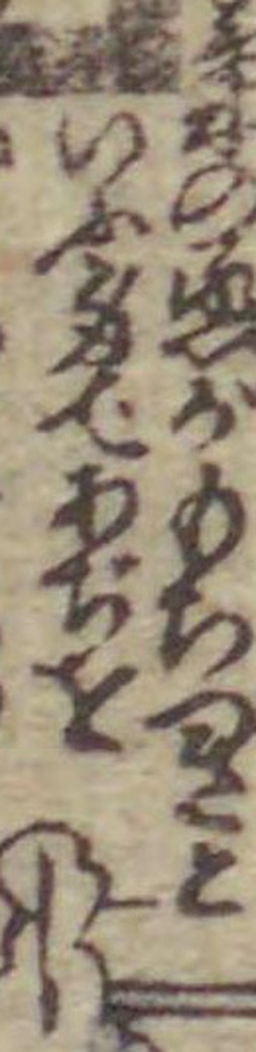いふ身であぢを
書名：娜二代鉢木 5巻
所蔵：国立国会図書館 National Diet Library, JAPAN
